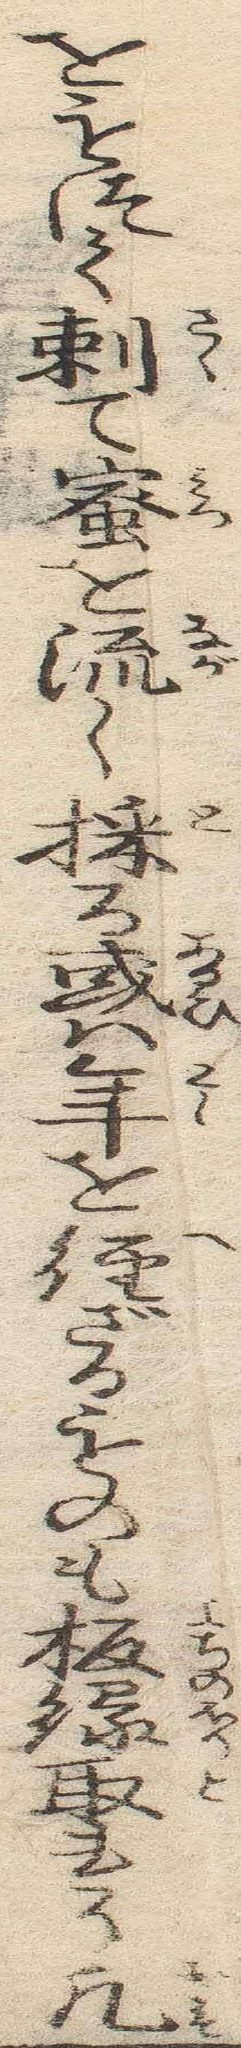をもつて刺て蜜を流し採る或は年を経ざるものも板縁取れり凡
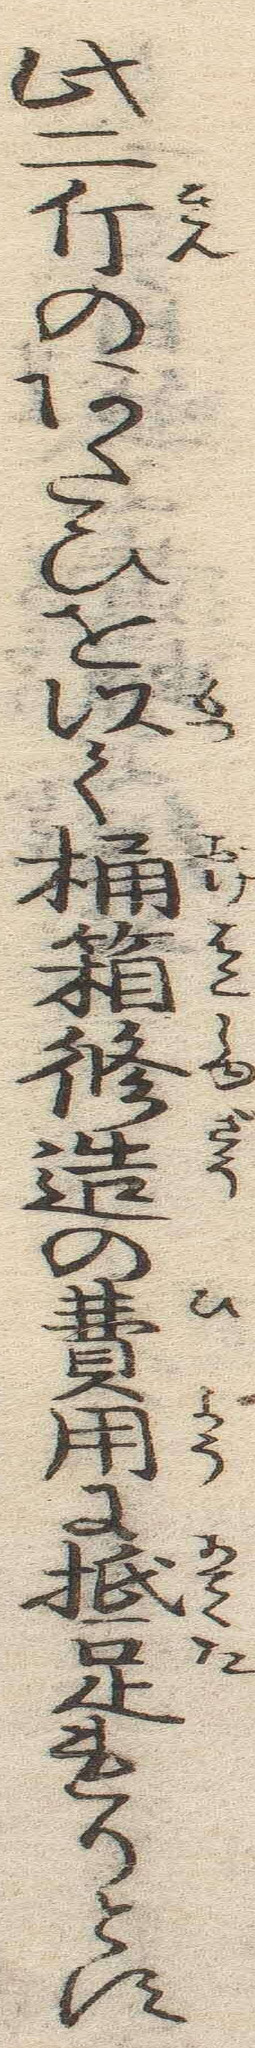此二斤のあたひを以て桶箱修造の費用に抵足れりとす
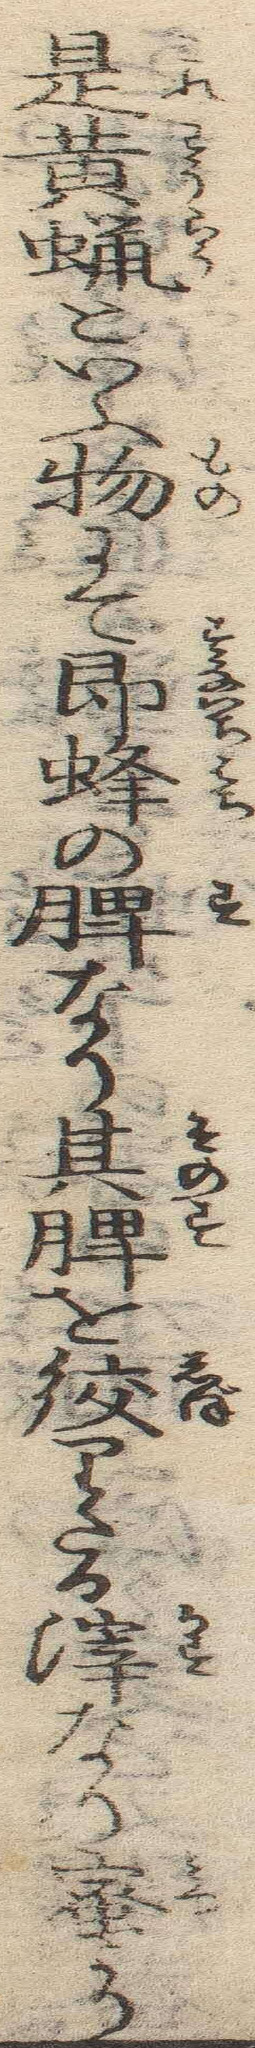是黄蝋といふ物にて即蜂の脾なり其脾を絞りたる滓なり蜜より
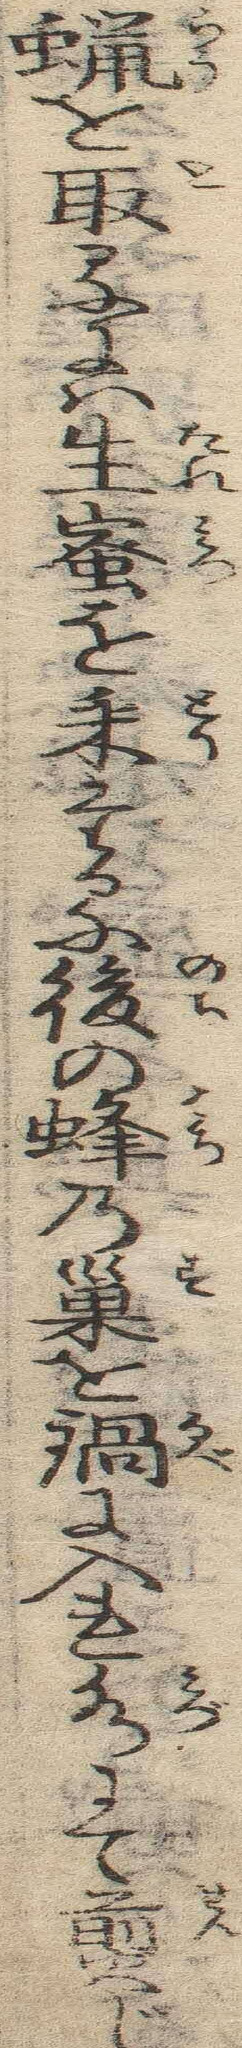蝋を取るには生蜜を采たる後の蜂の巣を鍋に入れ水にて煎じ

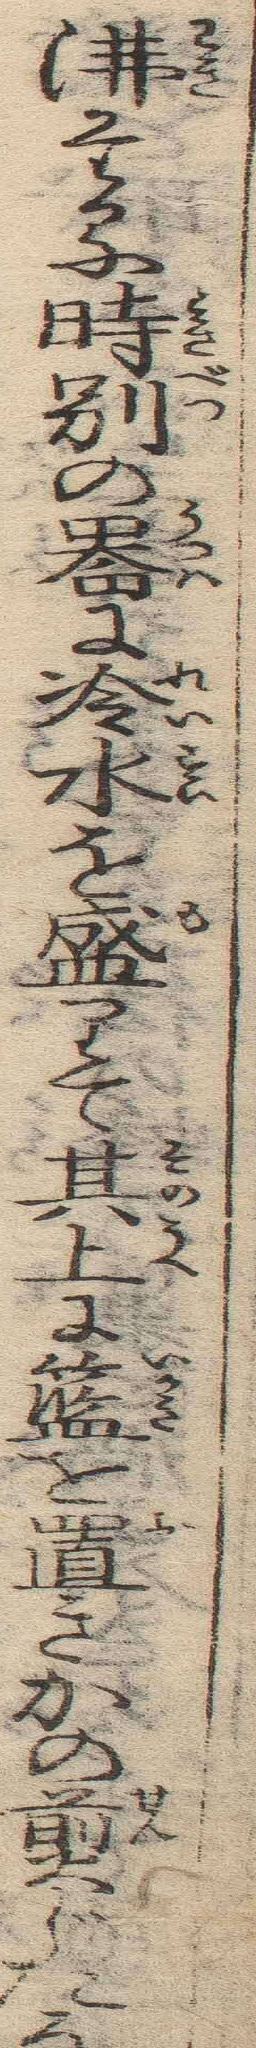沸たる時別の器に冷水を盛りて其上に籃を置きかの煎じたる
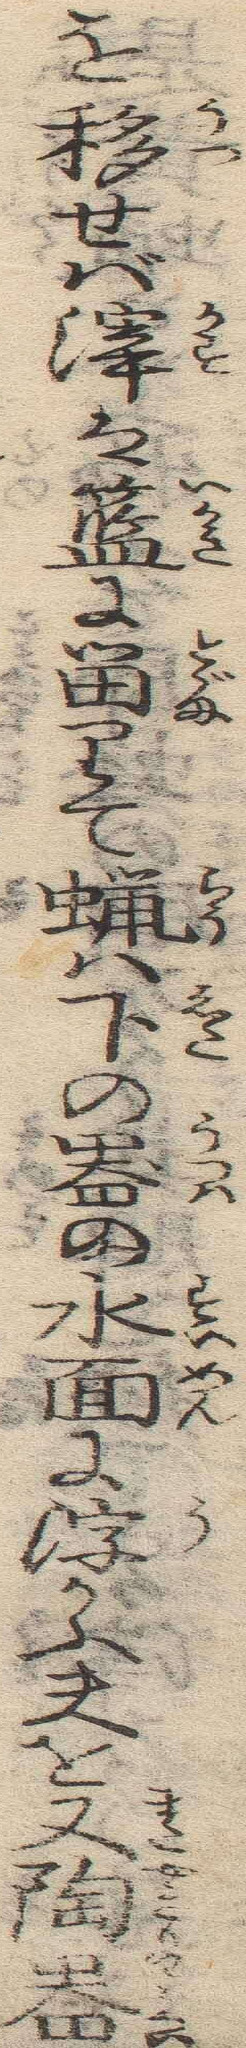を移せば滓は籃に留りて蝋は下の器の水面に浮かふ夫を又陶器
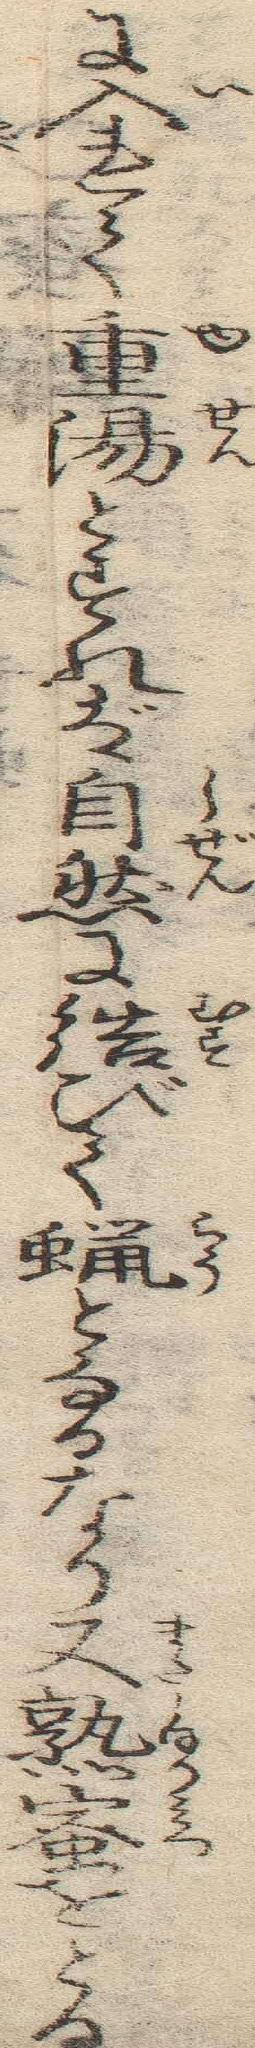に入れて重湯とすれば自然に結びて蝋となるなり又熟蜜をとる
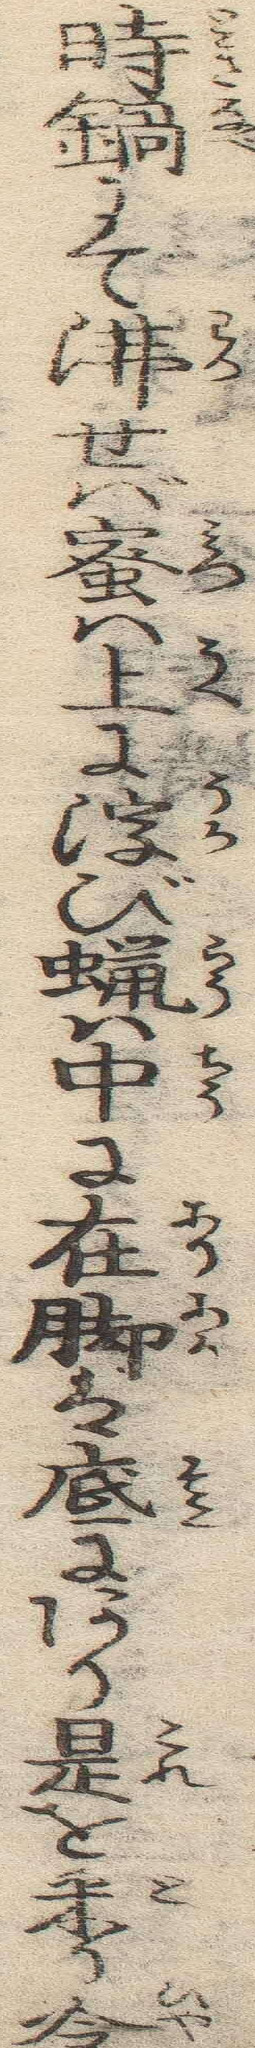時鍋にて沸せば蜜は上に浮び蝋は中に在脚は底にあり是を采り冷
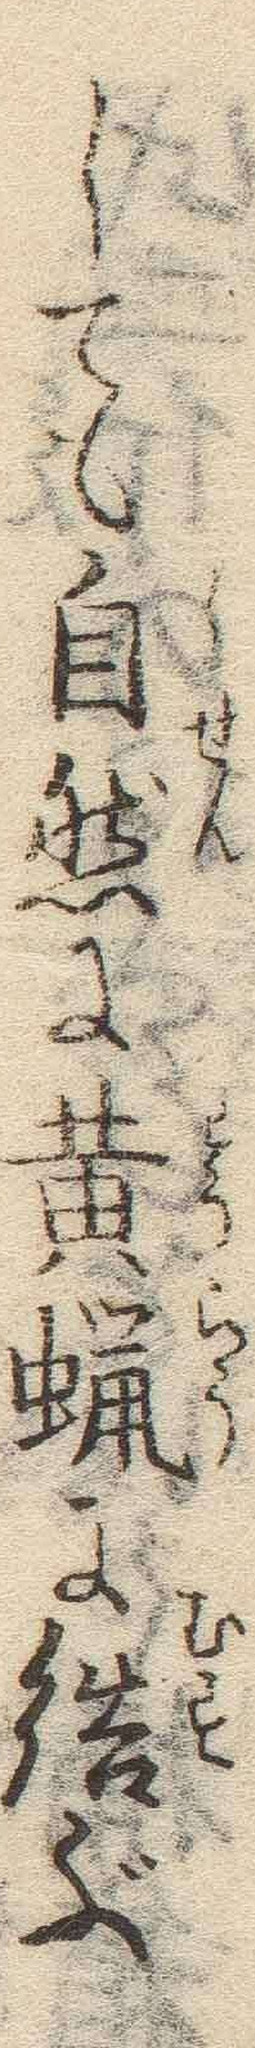しても自然に黄蝋に結ぶ
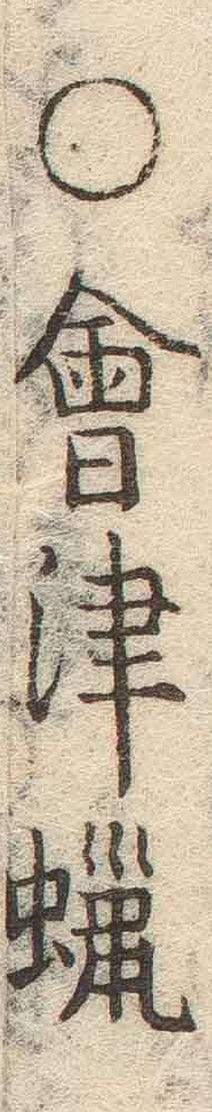○会津蝋
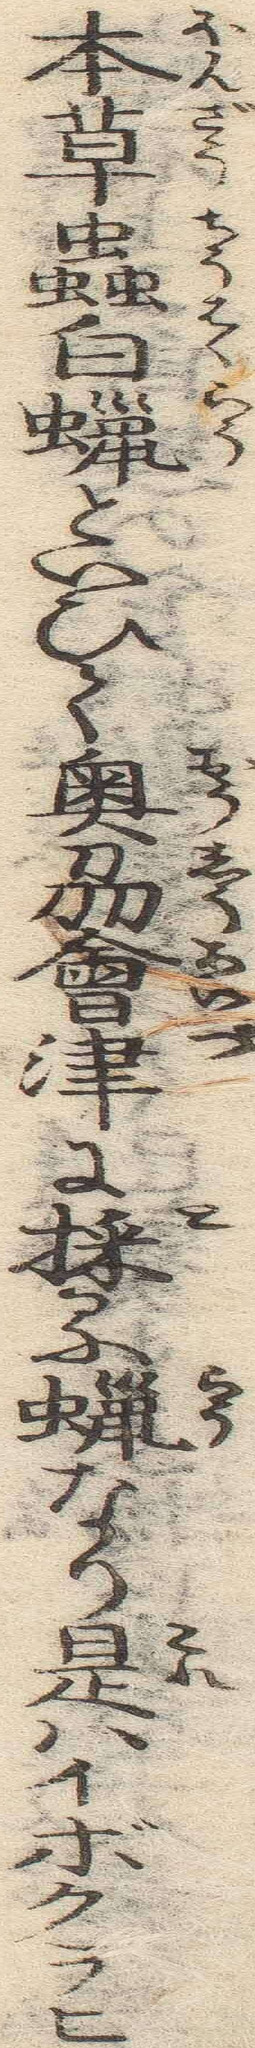本草虫白蝋といひて奥州会津に採る蝋なり是はイボクラヒ
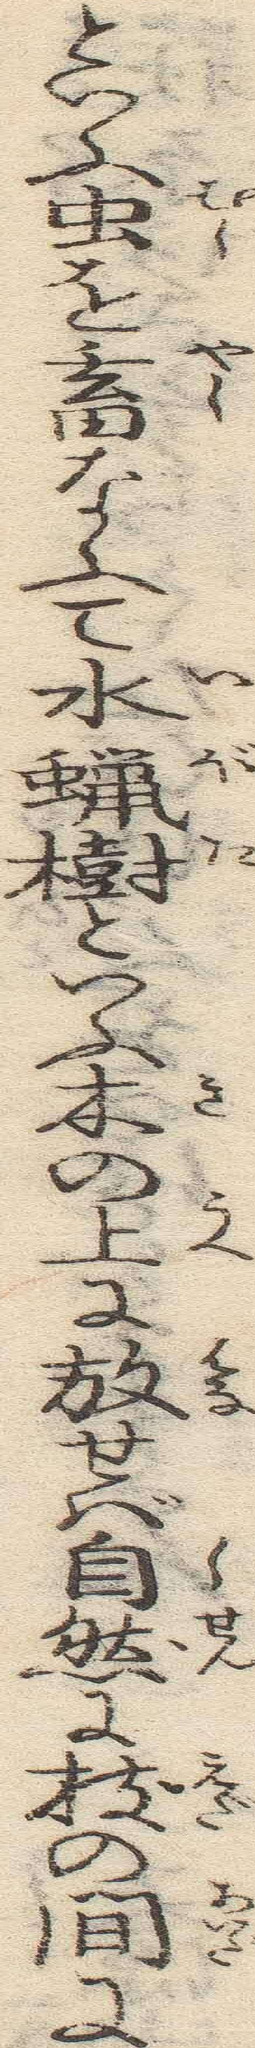といふ虫を畜なふて水蝋樹といふ木の上に放せば自然に枝の間に
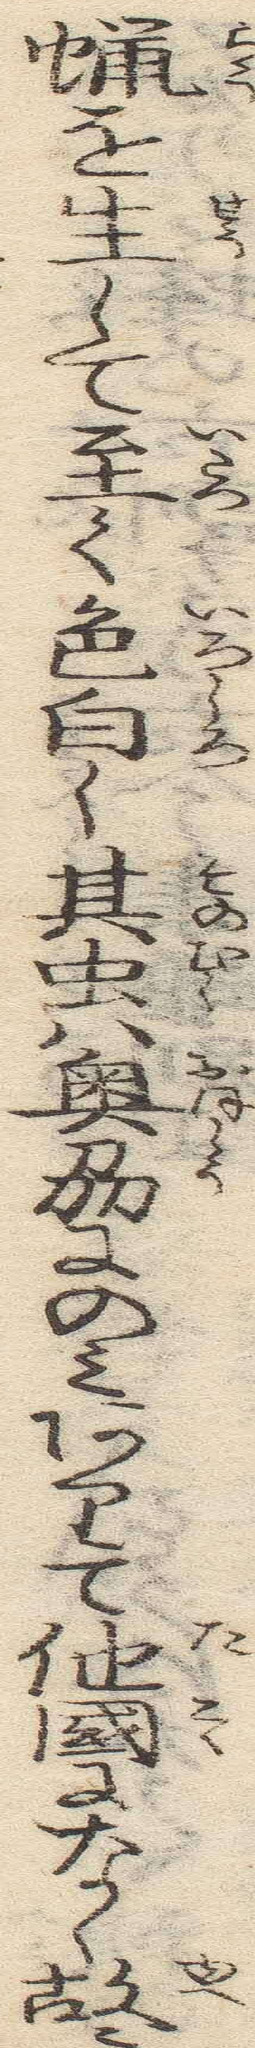蝋を生して至て色白く其虫は奥州にのみありて他国になし故に
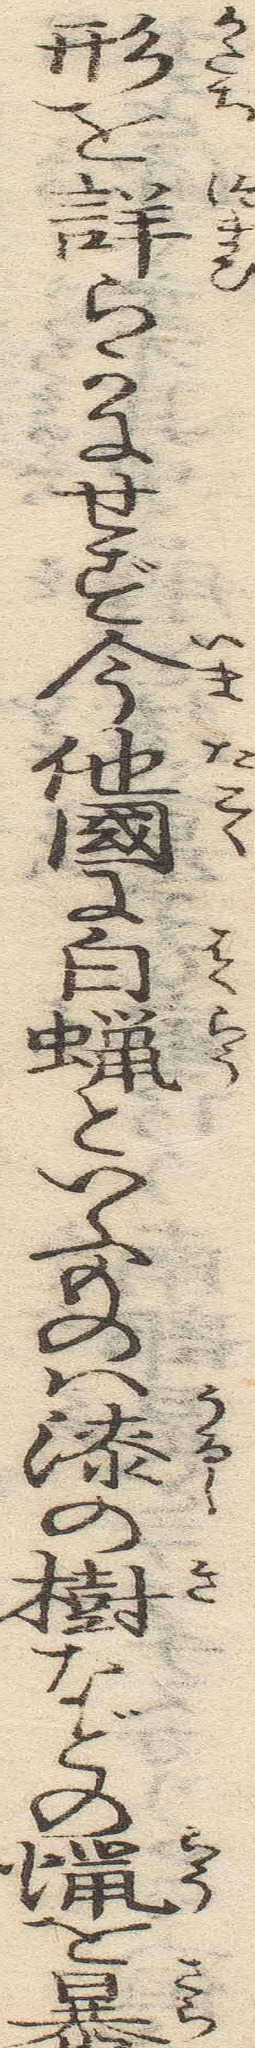形を詳らかにせず今他国に白蝋といふものは漆の樹などの蝋を暴
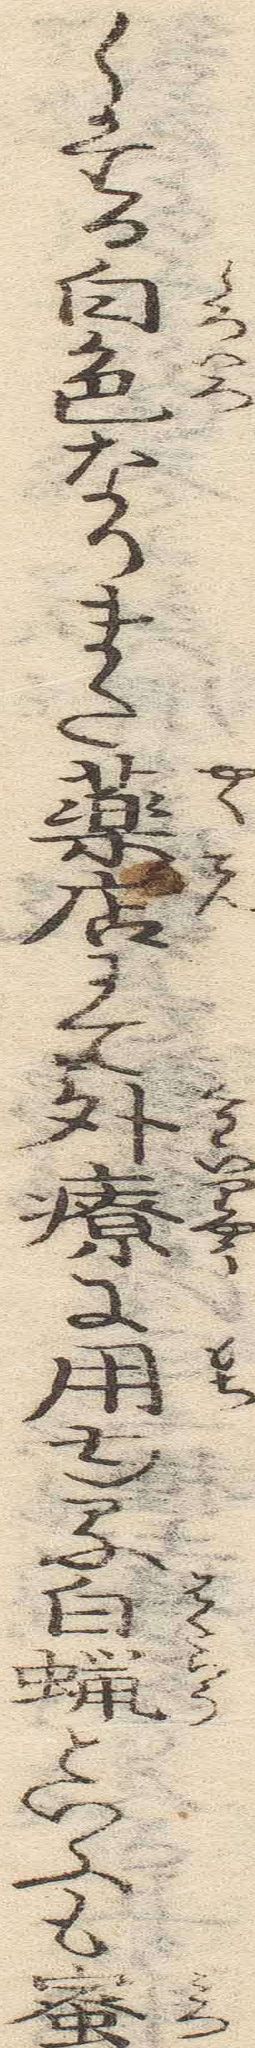したる白色なりまた薬店にて外療に用ゆる白蝋といふも蜜
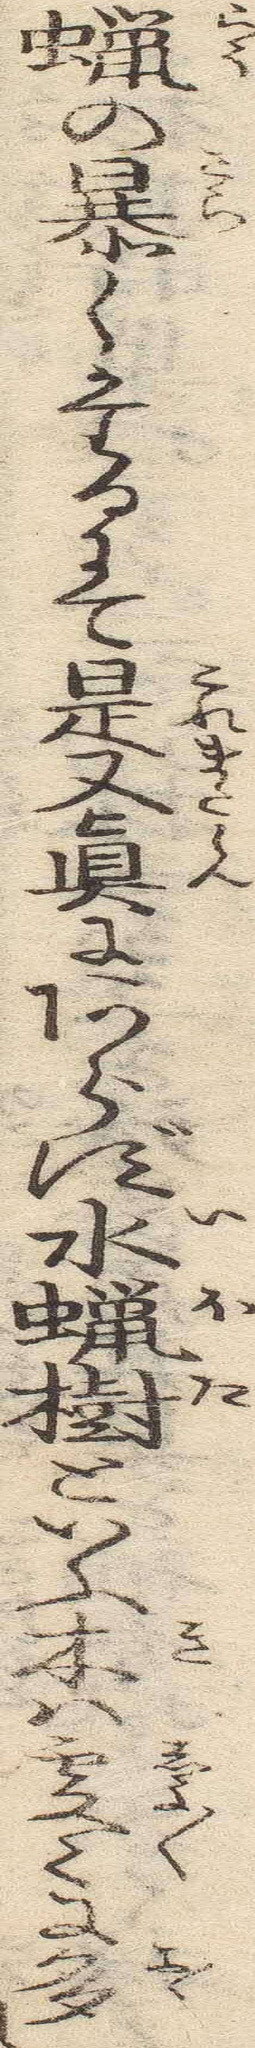蝋の暴したるにて是又真にあらず水蝋樹といふ木は処々に多し
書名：日本山海名産図会
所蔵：東京学芸大学附属図書館 国文学研究資料館
